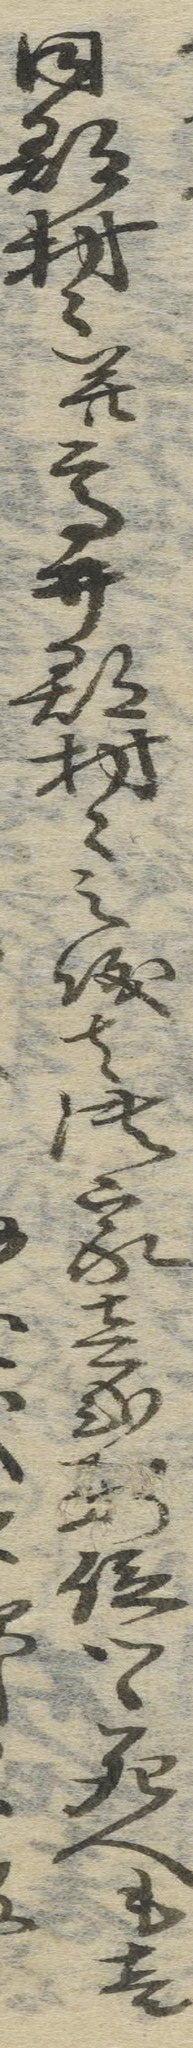同郡村々并高井郡村々之儀は潰家壱弐軒位ツゝ死人も壱
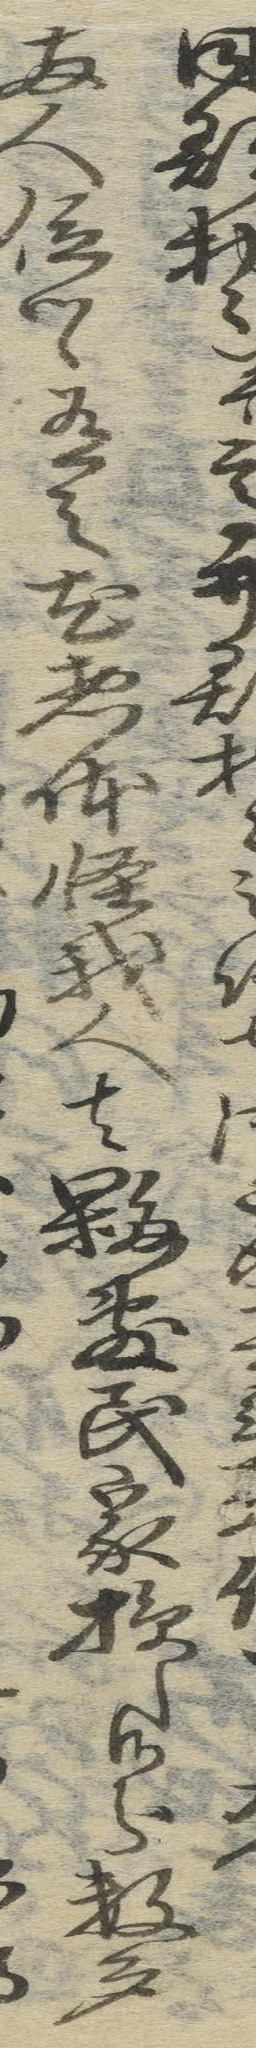両人位ツゝ有之尤惣体怪我人は夥敷民家損し候分数多
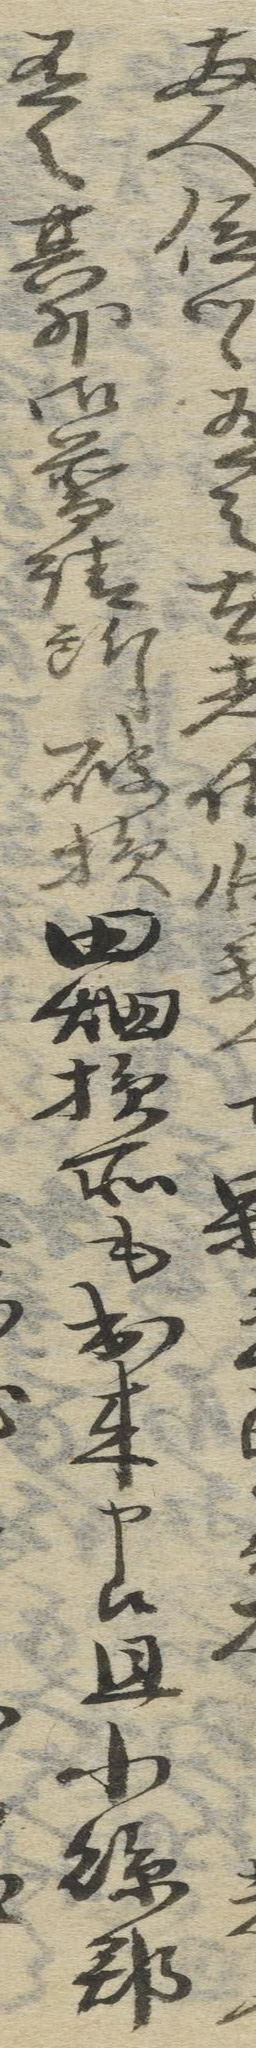有之其外御普請所破損田畑損所も出来申候且小県郡
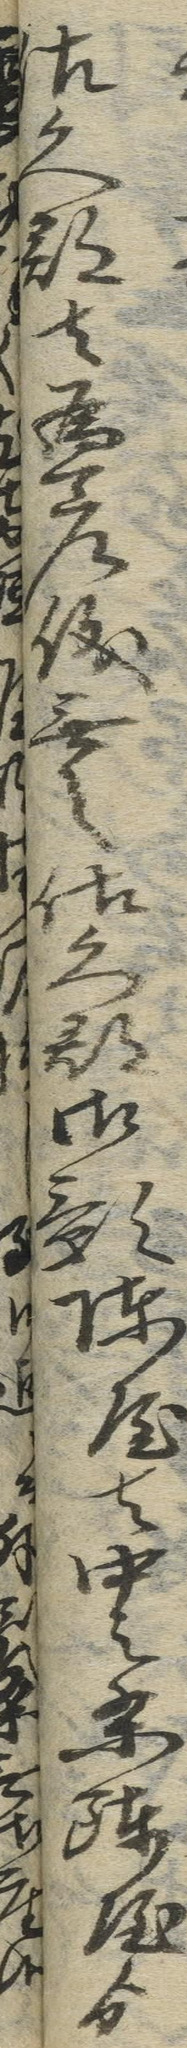佐久郡は為差儀無之佐久郡御預陣屋者中之条陣屋ゟ
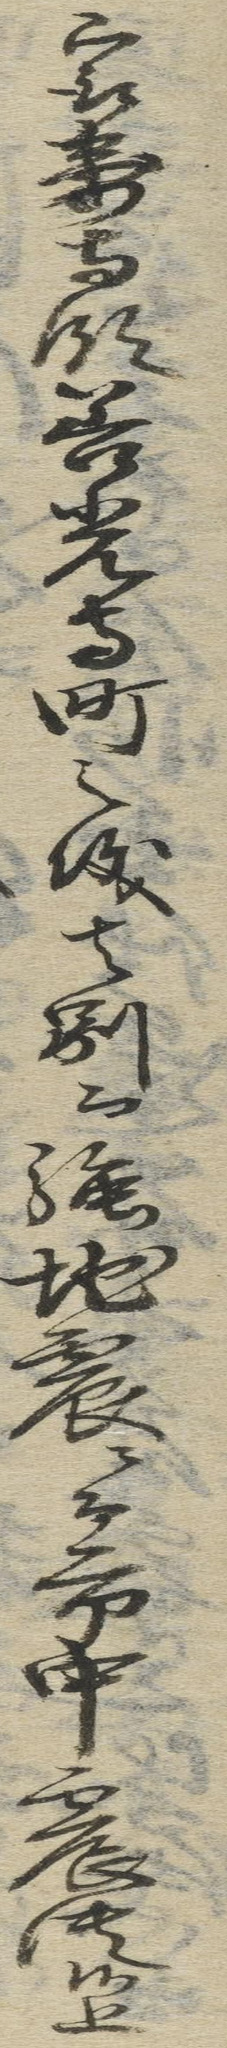一最寄寺領善光寺町之儀は別而強地震二而市中震候上
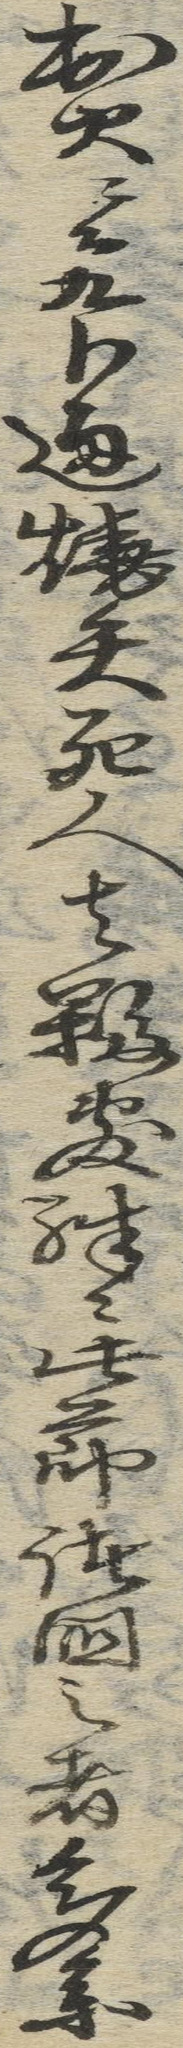出火二而九分通焼失死人は夥敷殊二此節諸国之者多参
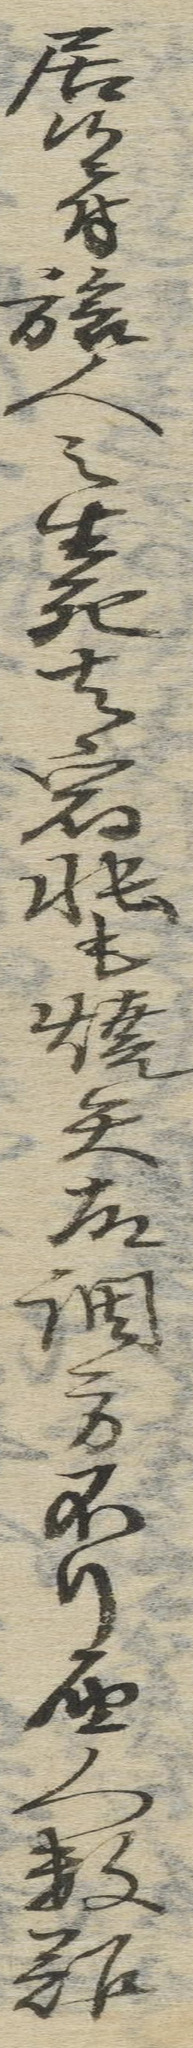居候二付旅人之生死は宿帳も焼失故調方不行届人数難
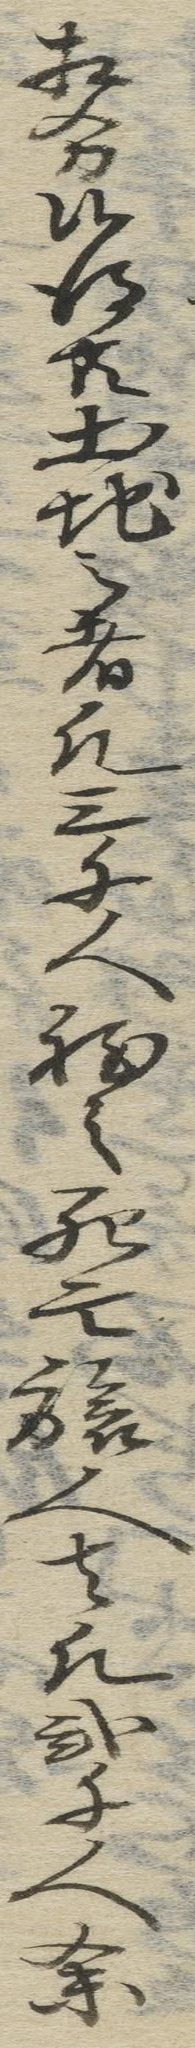相分候得共土地之者凡三千人程之死亡旅人は凡弐千人余
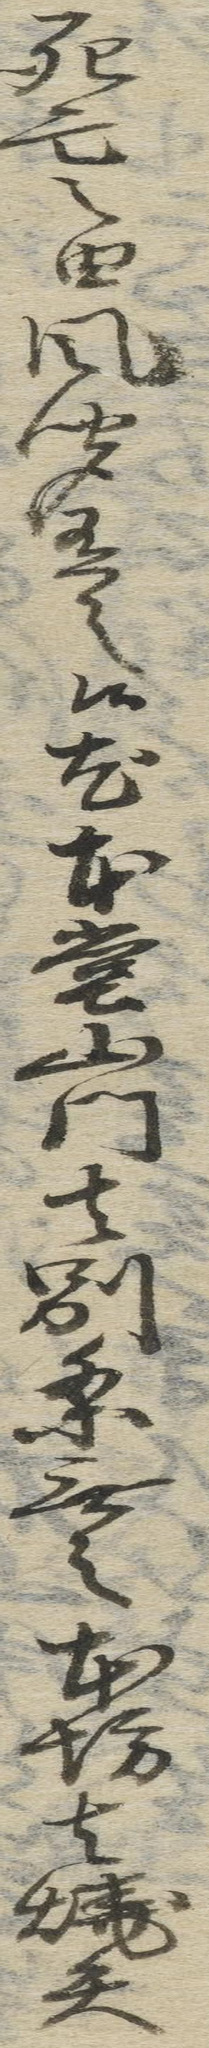死亡之由風聞有之候尤本堂山門は別条無之本坊は焼失
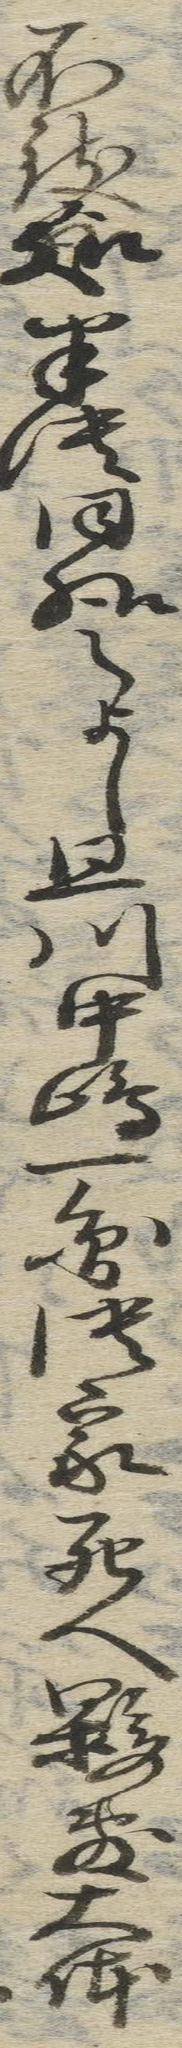不致候処半潰同様之よし且川中嶋一圓潰家死人夥敷大体
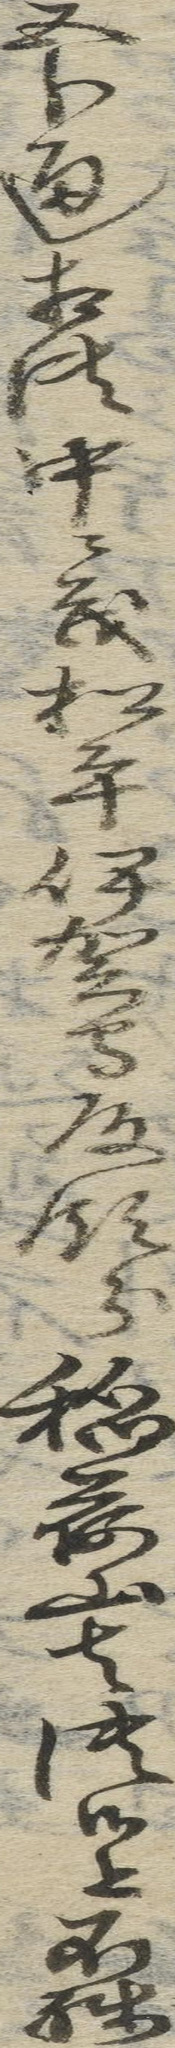五分通相潰中二も松平伊賀守殿領分稲荷山者潰候上不残
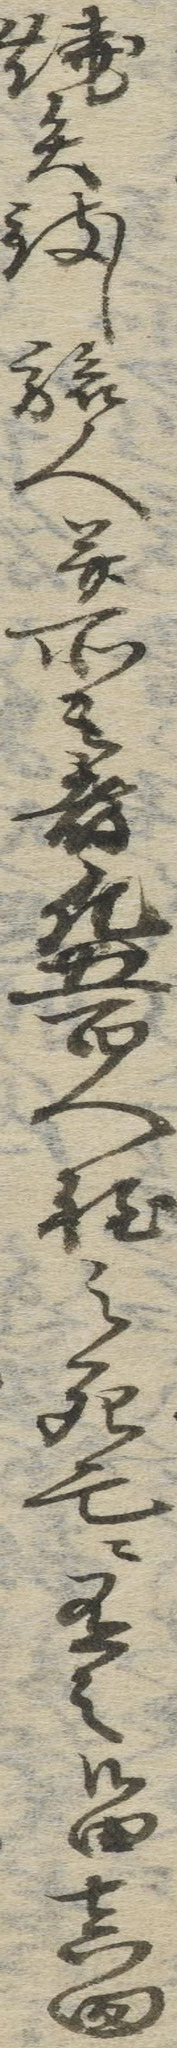焼失致し旅人并所之者凡五百人程之死亡二有之候由真田
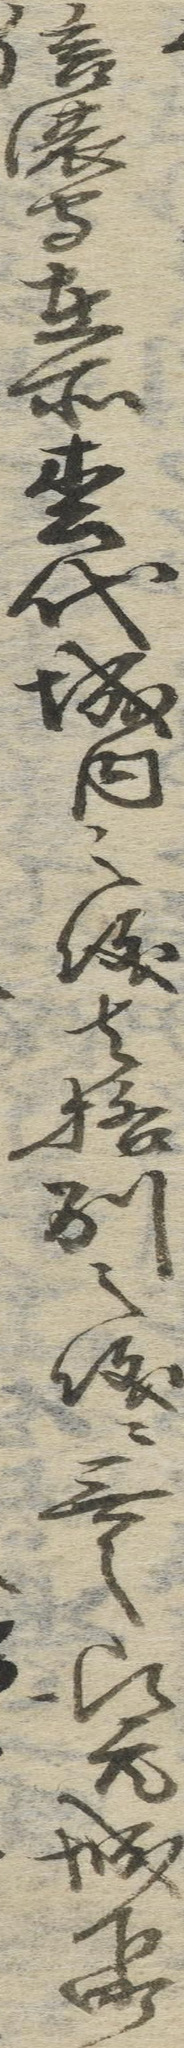信濃守在所松代城内之儀は格別之儀二無之候得共城下町
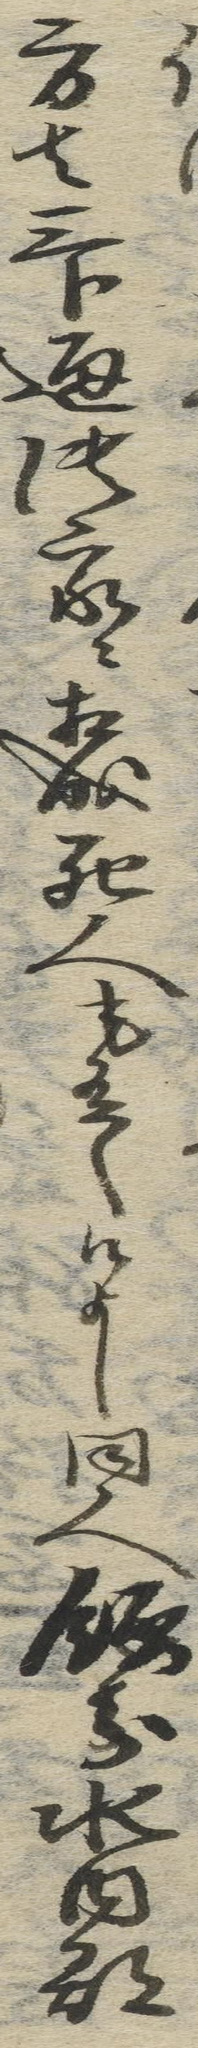方は三分通潰家二相成死人も有之候よし同人領分水内郡
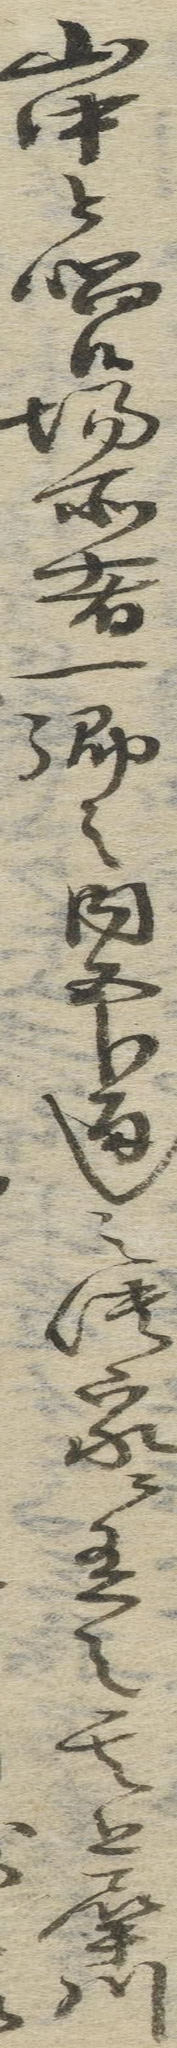山中と唱候場所は一郷之内五分通之潰家二有之其上犀川
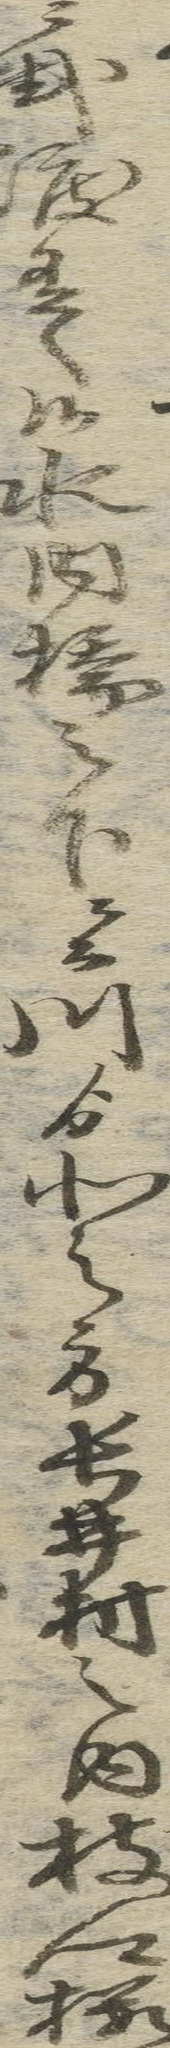二掛渡有之候水内橋之下二而川ゟ北之方長井村之内枝郷桜
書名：信濃越後　地震書留
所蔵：東京大学地震研究所図書室 Earthquake Research Institute Library, The University of Tokyo, JAPAN
